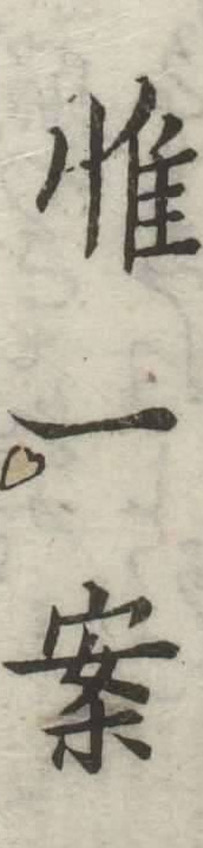惟一案
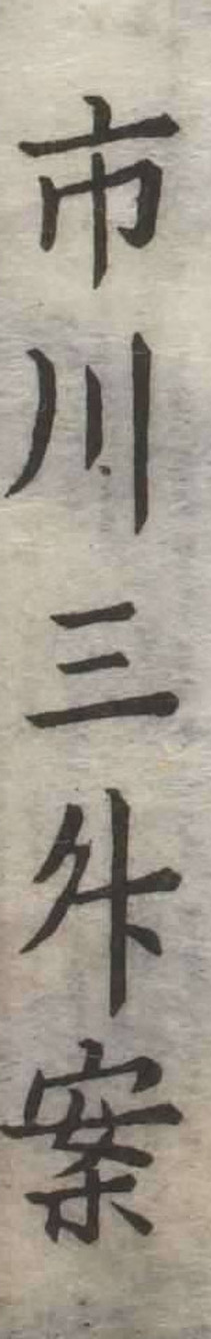市川三升案

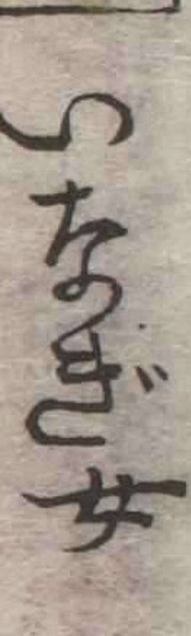いなぎ女
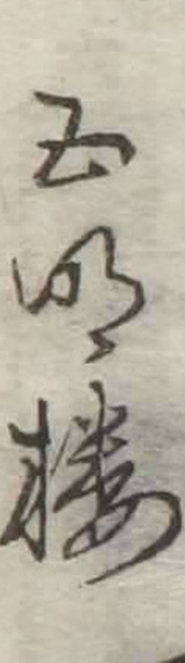五明楼
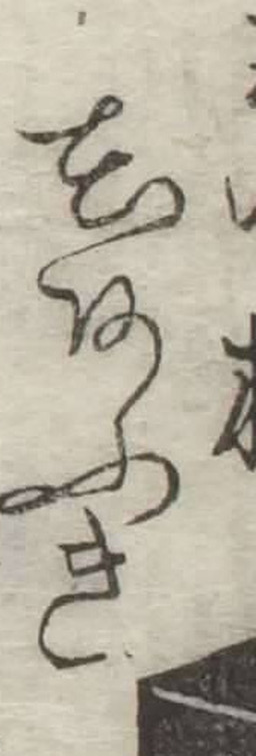花あふき
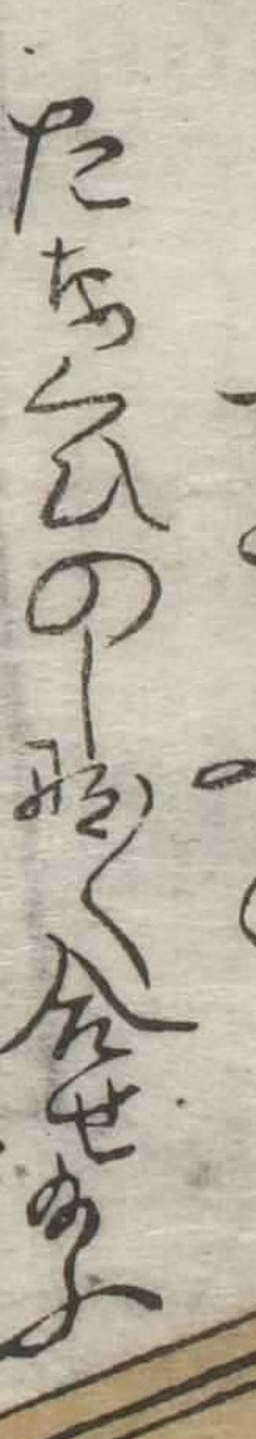たなくひのしな〳〵合せ給ふ
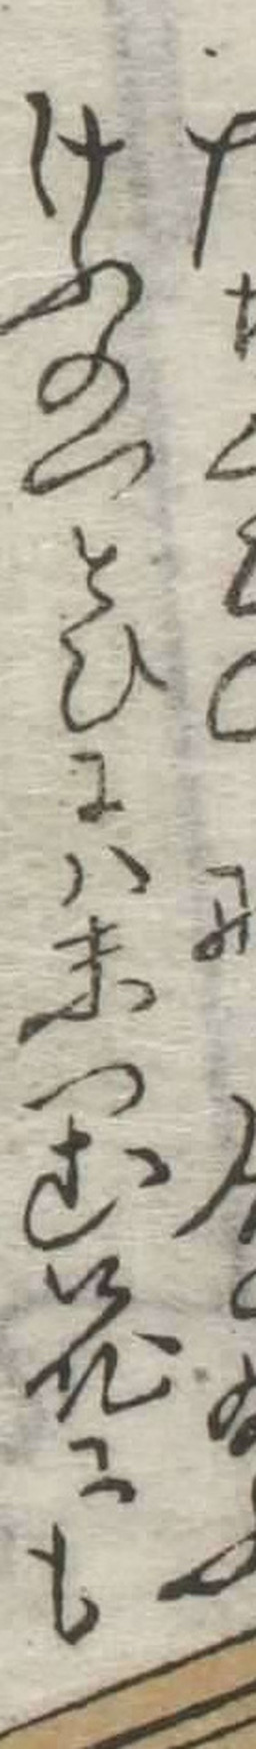けふのつとひには末つむ花にも
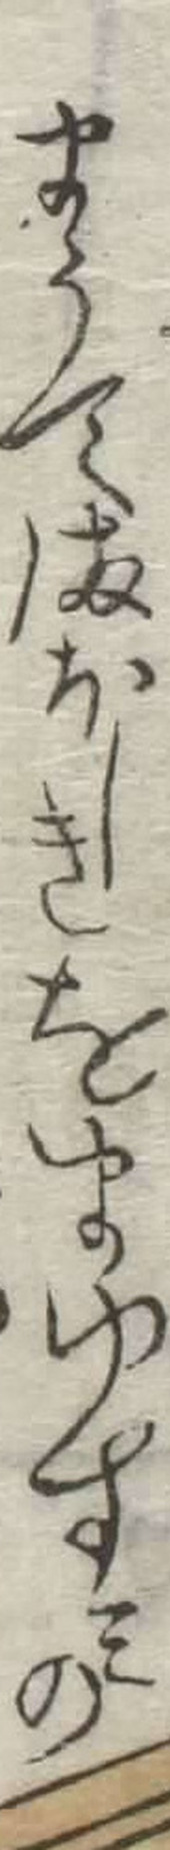まうてまほしきをまゆすみの
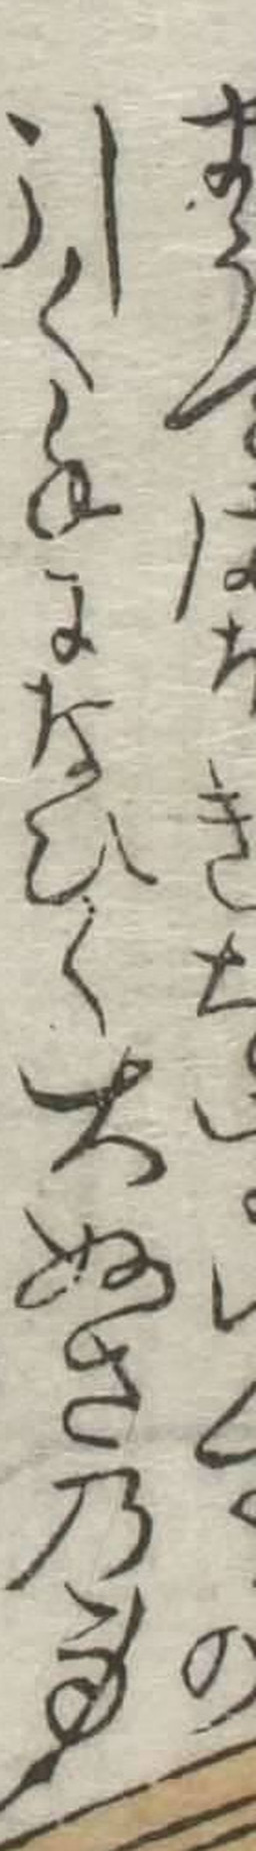引く手になひく大ぬさの身
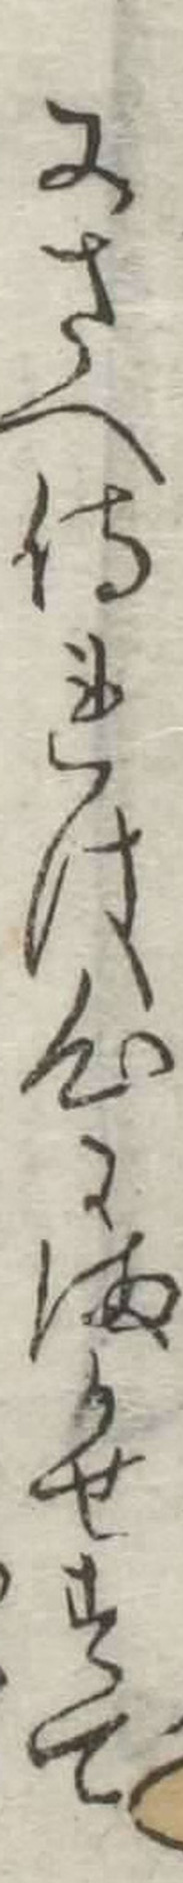にさへ侍れは心にまかせすて
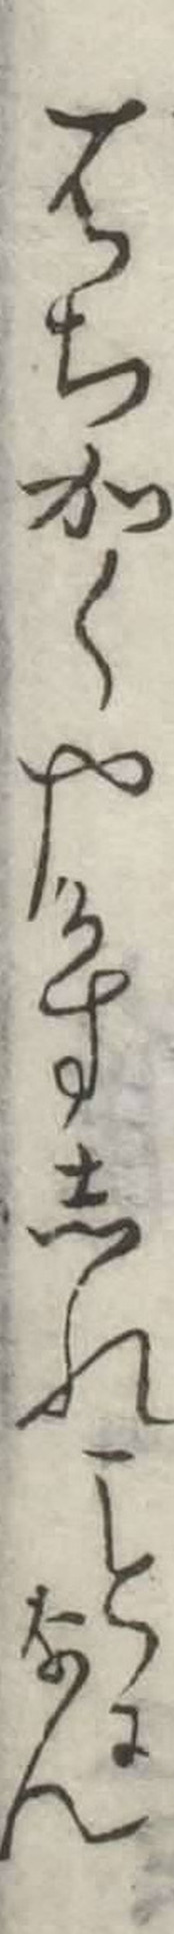はちかくやうすしれことになん
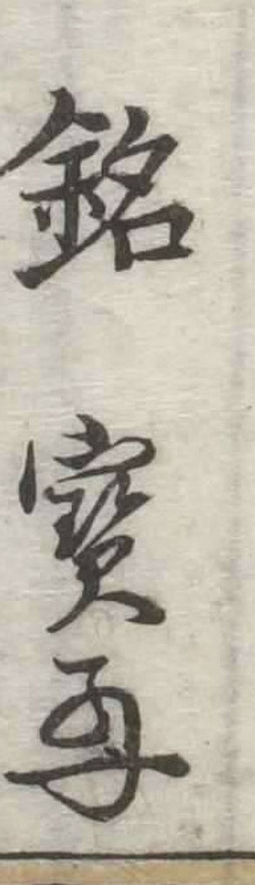銘宝舟
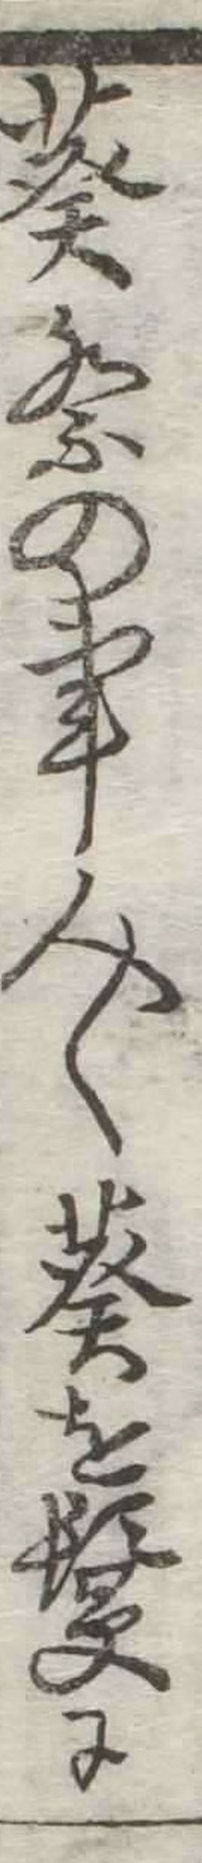葵祭の事人〳〵葵を鬘に
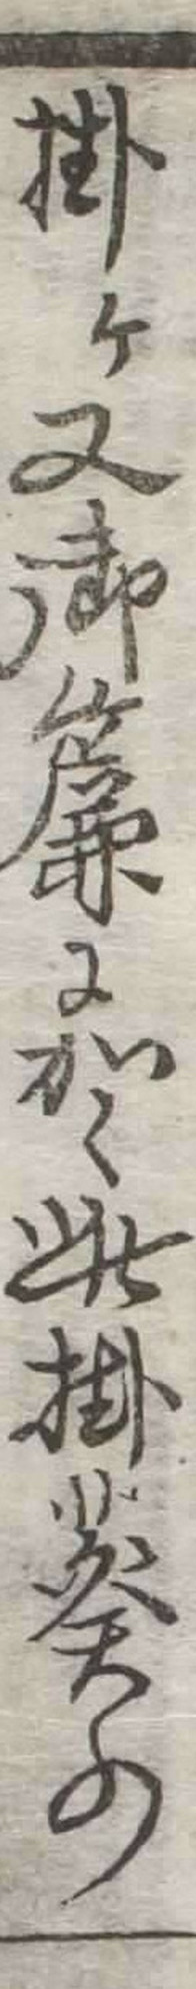掛け又御簾にかく此掛葵の
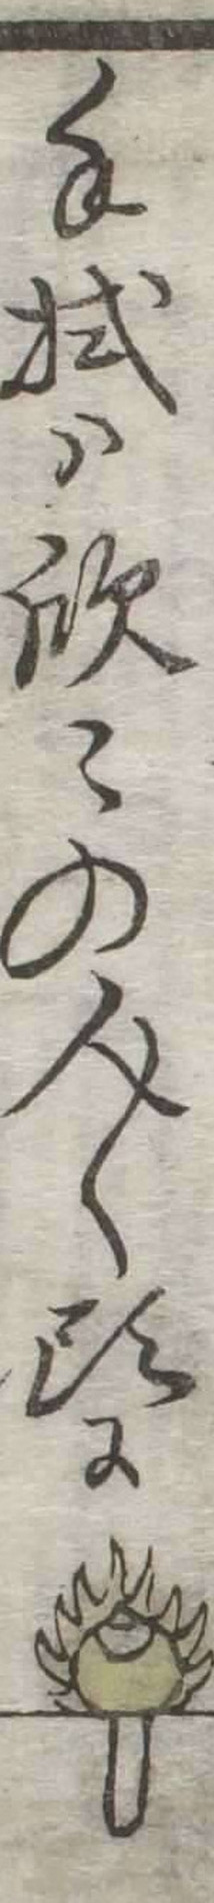手拭は欣々の人〳〵頭に
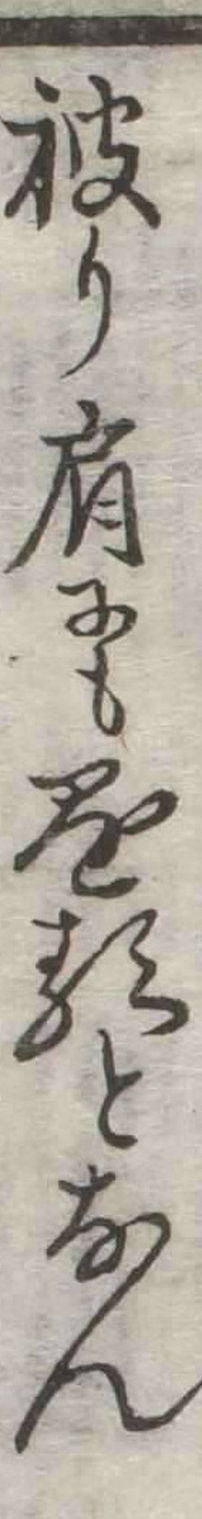被り肩にも懸るとなん
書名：たなくひあわせ
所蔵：国文学研究資料館
